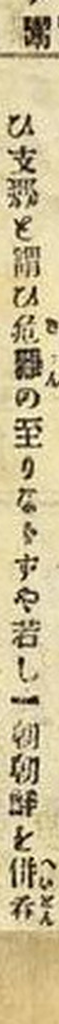ひ支那と謂ひ危験の至りならずや若し一朝朝鮮を併呑
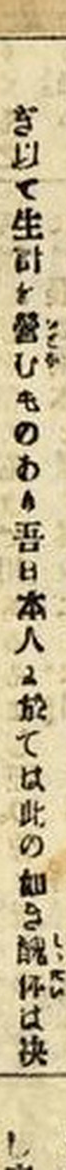ぎ以て生計を営むものあり吾日本人に於ては此の如き醜体は決
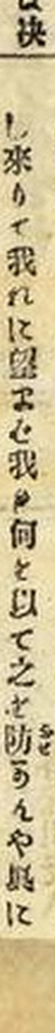し来りて我れに望まば我れ何を以て之を防かんや実に
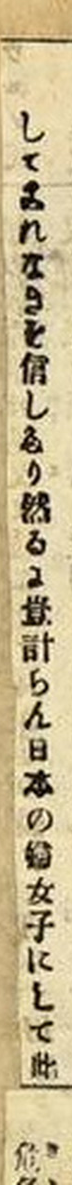してこれなきを信したり然るに豈計らん日本の婦女子にして此
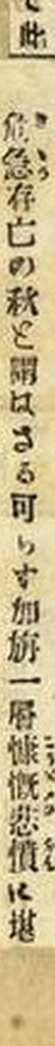危急存亡の秋と謂はさる可らす加旃一層慷慨悲憤に堪

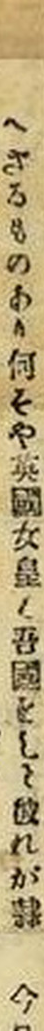へざるものあり何そや英国女皇は吾国をして彼れが隷
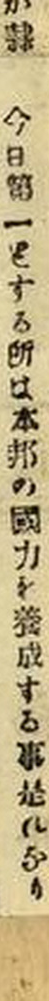今日第一とする所は本邦の国力を養成する事是れなり
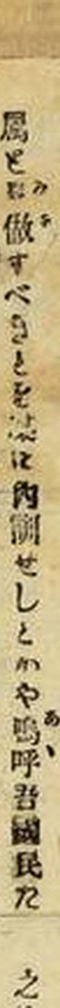属と見做すべきことを某に内調せしとかや嗚呼吾国民た
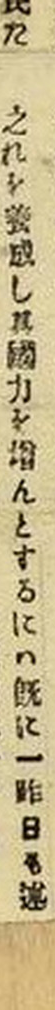之れを養成し其国力を増んとするには既に一昨日も述
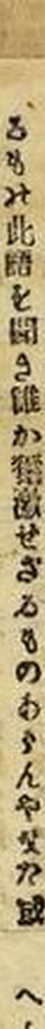るもの此語を聞き誰か奮激せざるものあらんや又た或
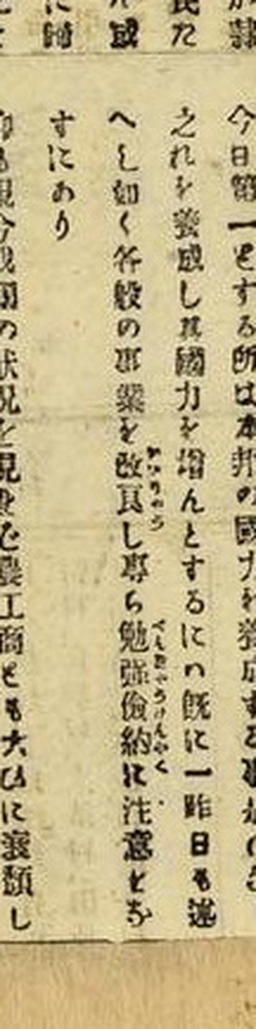へし如く各般の事業を改良し専ら勉強倹約に注意をな
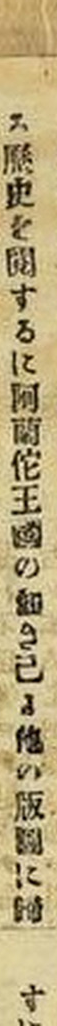る歴史を閲するに阿蘭佗王国の如き已に他の版図に帰
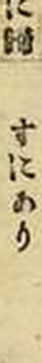すにあり
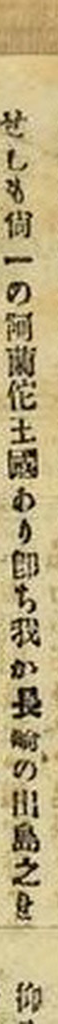せしも尚一の阿蘭佗王国あり即ち我が長崎の出島之れ
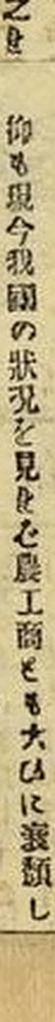抑も現今我国の状況を見れば農工商とも大ひに衰頽し
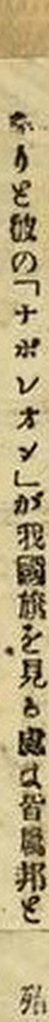なりと彼の「ナポレオン」が我国旗を見る処は皆属邦と
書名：温古集 五巻
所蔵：福井県文書館 Fukui Prefectural Archives
